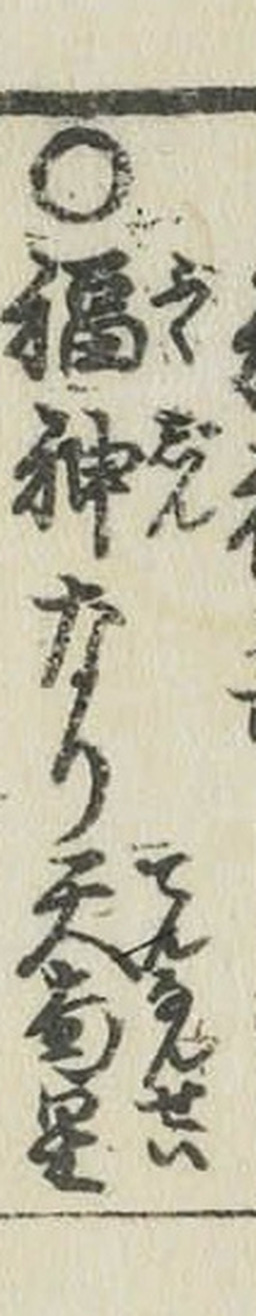○福神なり天南星
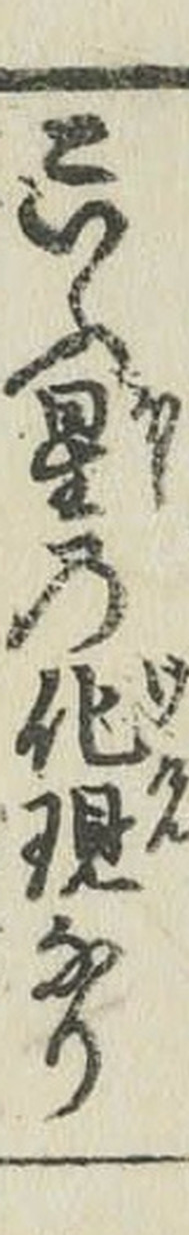といふ星の化現なり
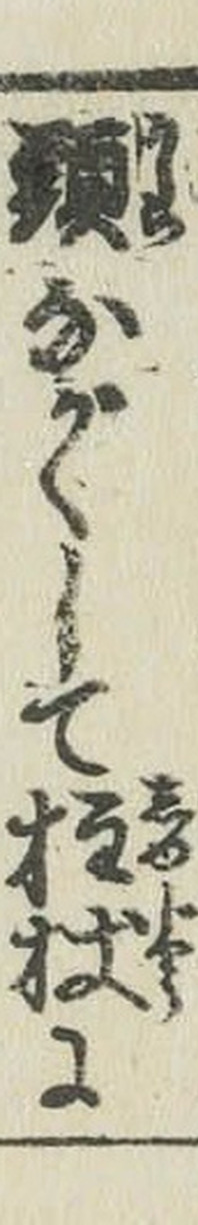頭ながくして拄杖に
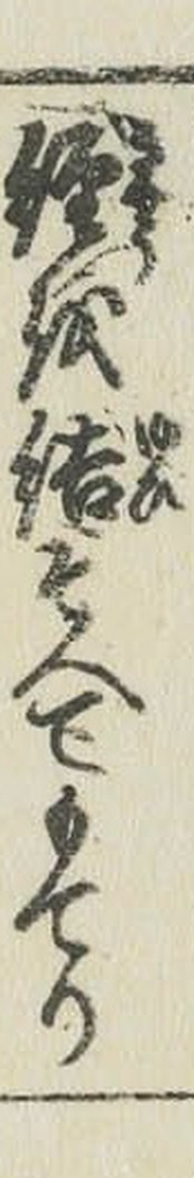経を結そへてもてり
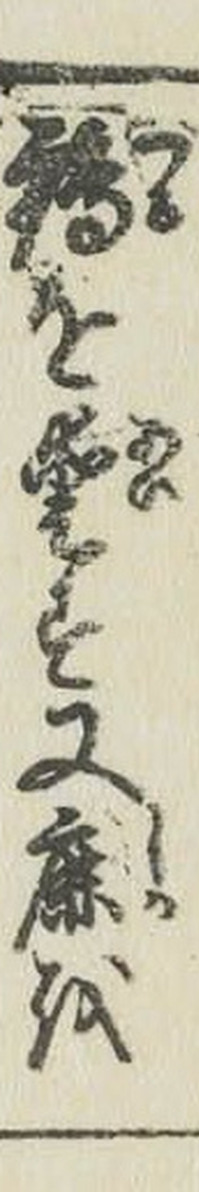鶴を愛す又鹿を
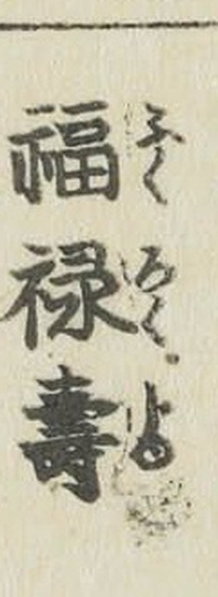福禄寿
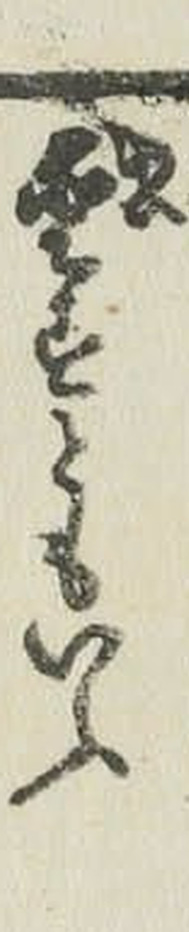愛すともいふ
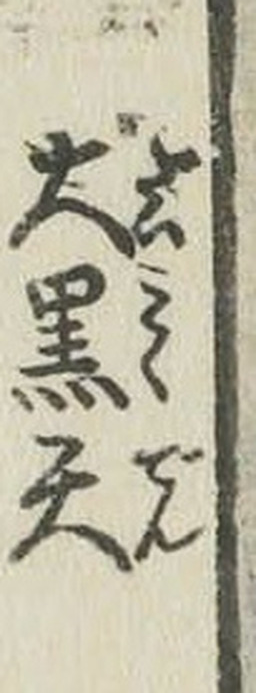大黒天
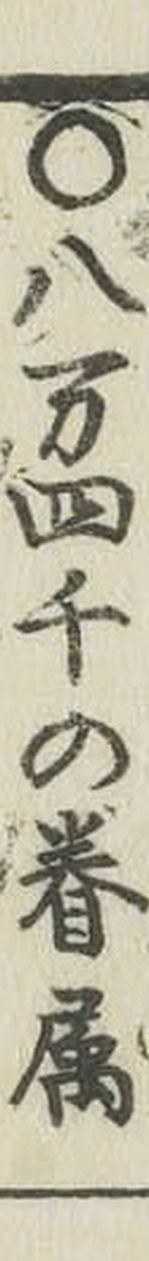○八万四千の眷属
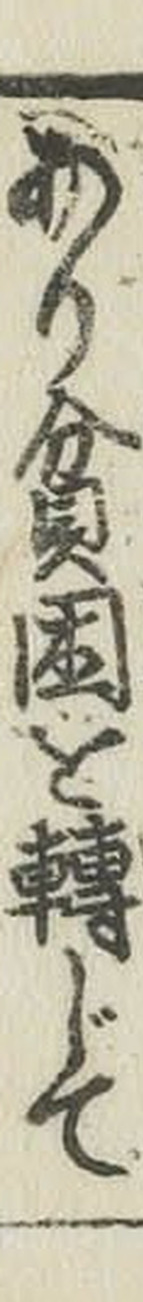あり貧困を転じて
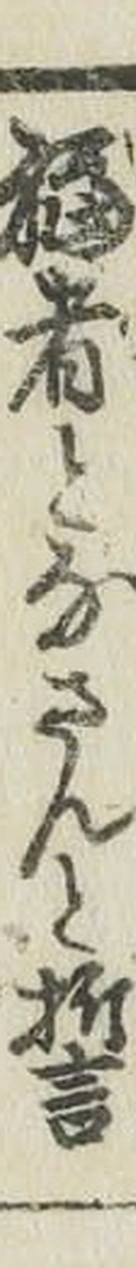福者となさんと誓
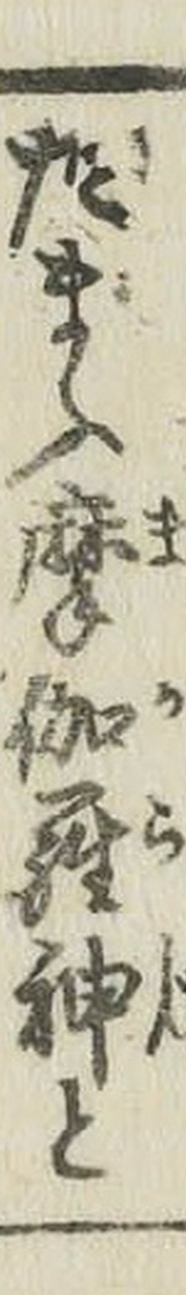たまふ摩伽羅神と
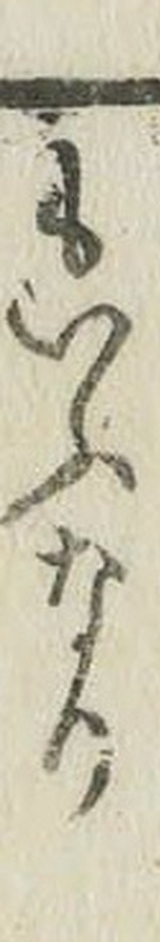もいふなり
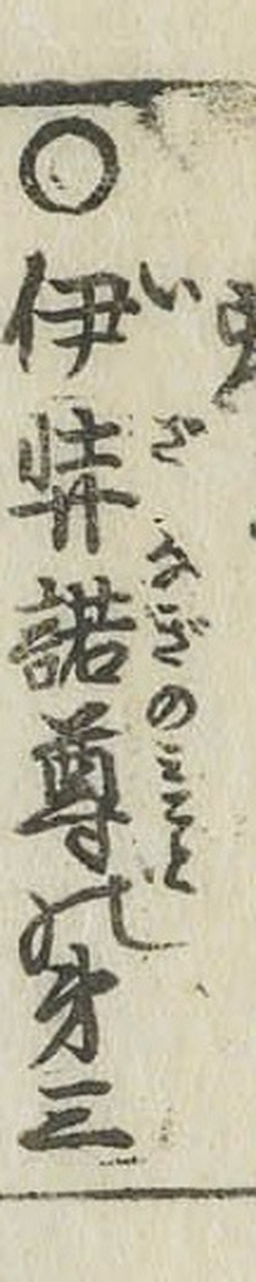○伊弉諾尊の第三
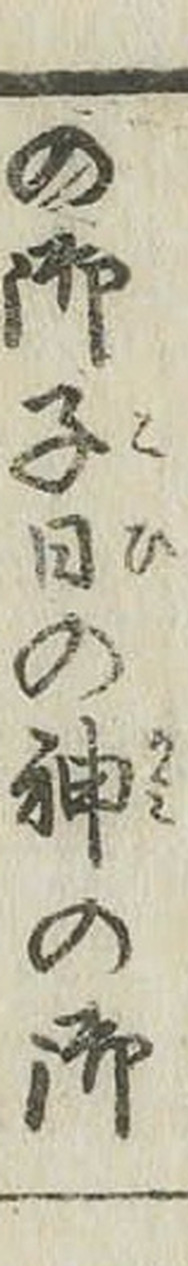の御子日の神の御
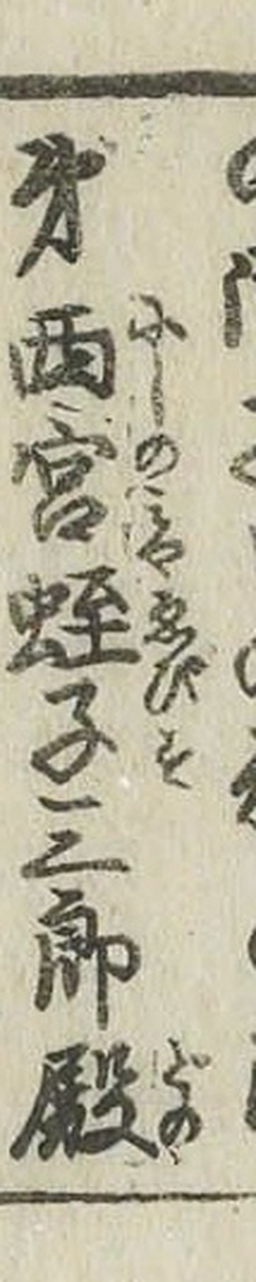弟西宮蛭子三郎殿
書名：増補頭書訓蒙図彙大成 10巻 10:巻之21
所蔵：東京学芸大学教育コンテンツアーカイブ
